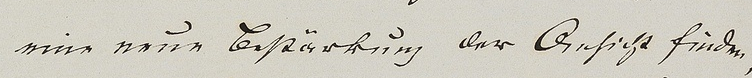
eine neue Bestärkung der Ansicht finden,
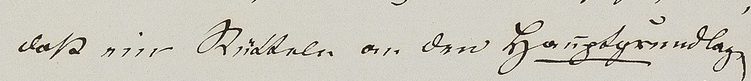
daß ein Rütteln an den Hauptgrundlagen
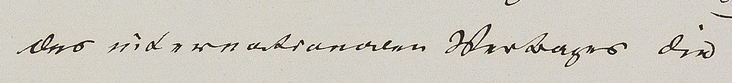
des internationalen Vertrages die
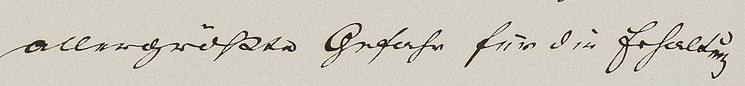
allergrößte Gefahr für die Erhaltung
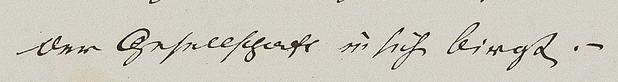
der Gesellschaft in sich birgt. –
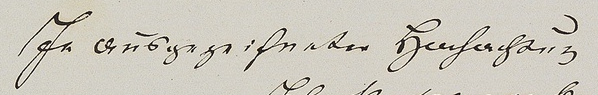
In ausgezeichneter Hochachtung
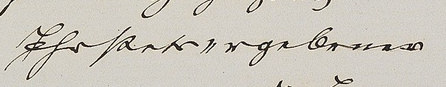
Ihr stets ergebener
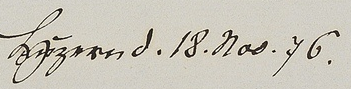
Luzern d. 18. Nov. 76.
